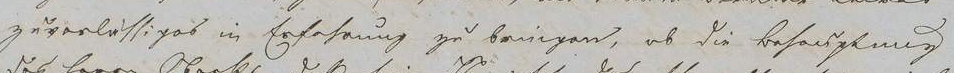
zuverlässiges in Erfahrung zu bringen, ob die Behauptung
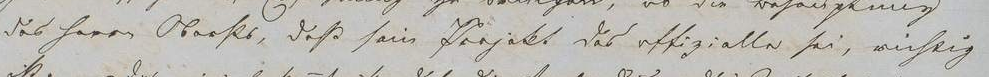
des Herrn oberst, daß sein Projekt das offizielle sei, richtig
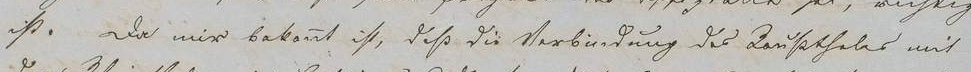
ist. Da mir bekannt ist, daß die Verbindung des Reussthales mit
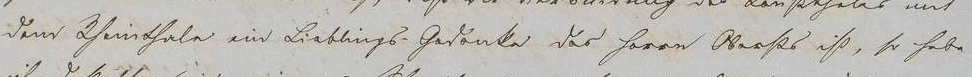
dem Rheinthale ein Lieblings-Gedanke des Herrn Obersts ist, so habe
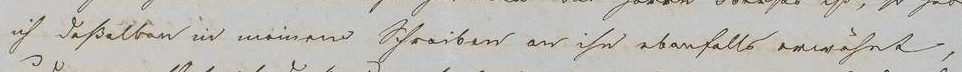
ich deßelben in meinem Schreiben an ihn ebenfalls erwähnt,
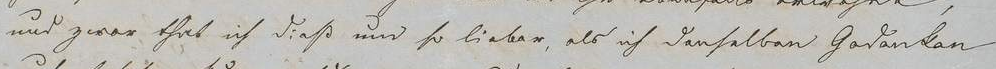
und zwar that ich dieß um so lieber, als ich denselben Gedanken
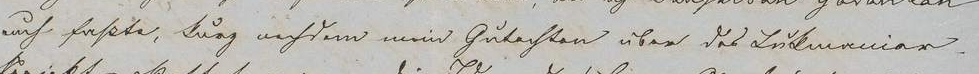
auch faßte, kurz nachdem mein Gutachten über das Lukmanier-
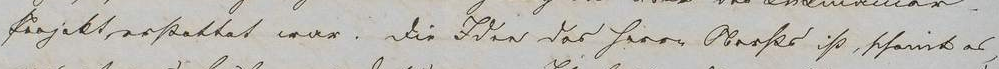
Projekt erstattet war. Die Idee des Herrn Obersts ist, scheint es,
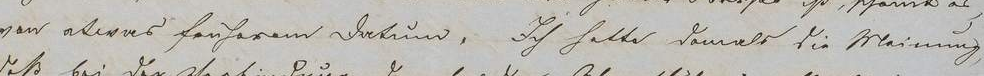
von etwas früherem Datum. Ich hatte damals die Meinung,
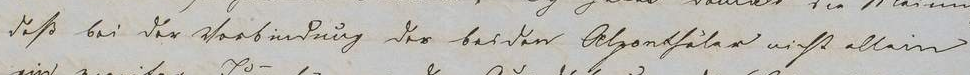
daß bei der Verbindung der beiden Alpenthäler nicht allein
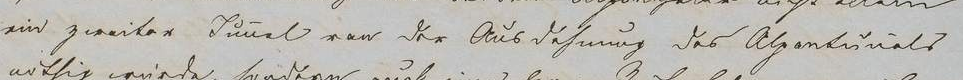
ein zweiter Tunnel von der Ausdehnung des Alpentunnels
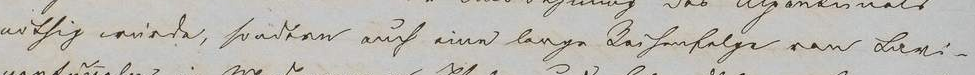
nöthig würde, sondern auch eine lange Reihenfolge von Lawi-
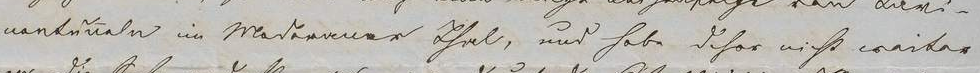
nentunneln im Maderaner Thal, und habe daher nicht weiter
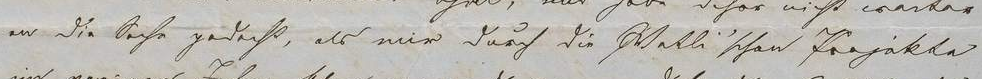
an die Sache gedacht, als mir durch die Wetli'schen Projekte
